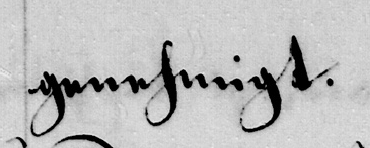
genehmigt.
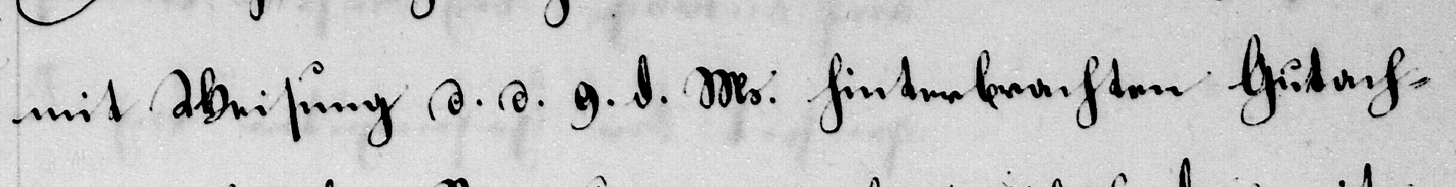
mit Weisung d. d. 9. d. Ms. hinterbrachten Gutach¬
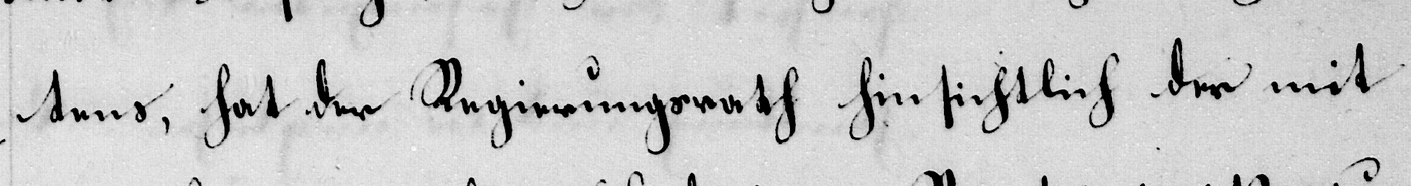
tens, hat der Regierungsrath hinsichtlich der mit
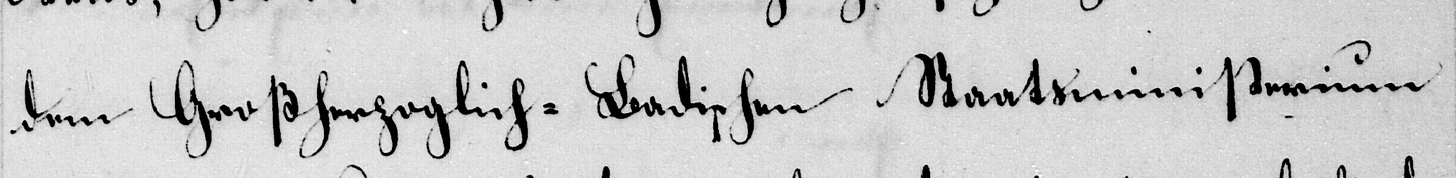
dem Großherzoglich-Badischen Staatsministerium
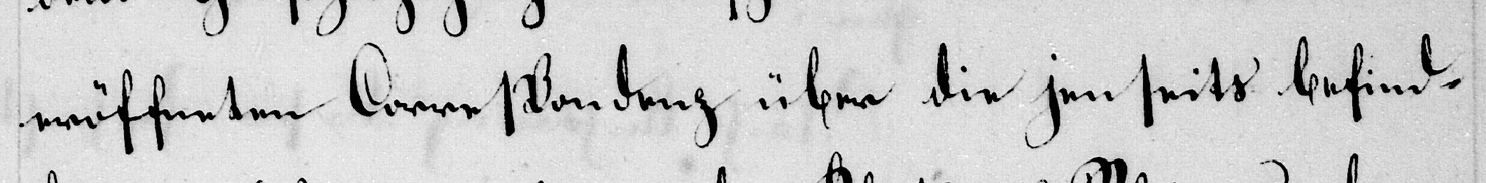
eröffneten Correspondenz über die jenseits befind¬
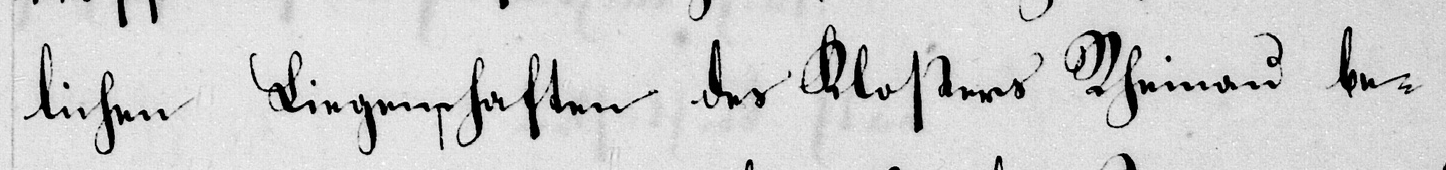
lichen Liegenschaften des Klosters Rheinau be¬
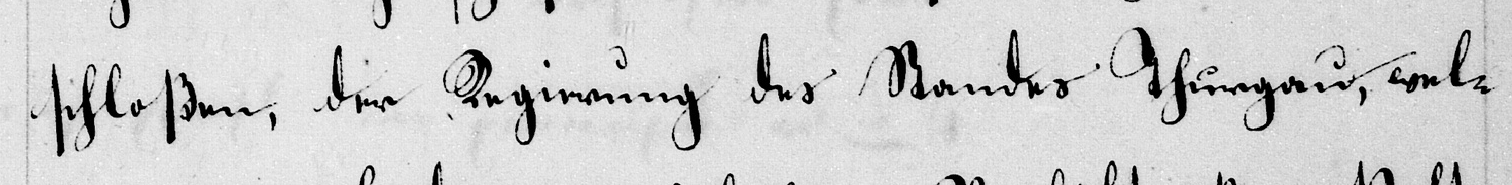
schloßen, der Regierung des Standes Thurgau, wel¬
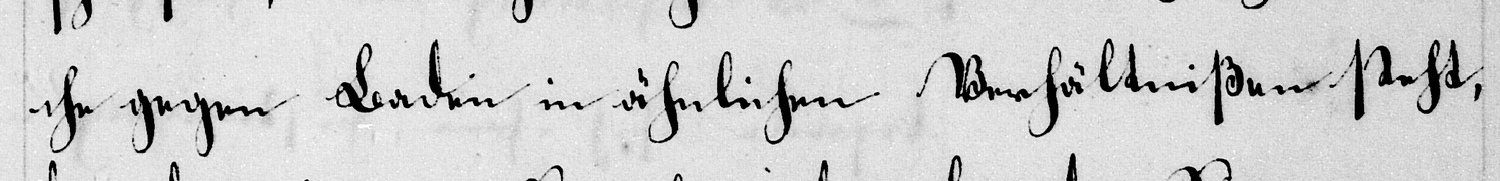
che gegen Baden in ähnlichen Verhältnißen steht,
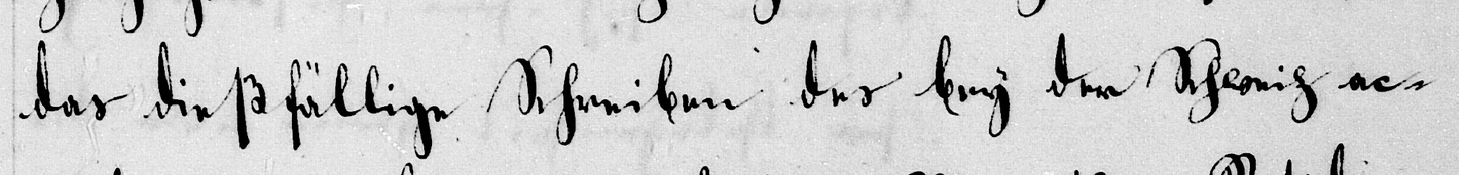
das dießfällige Schreiben des bey der Schweiz ac¬
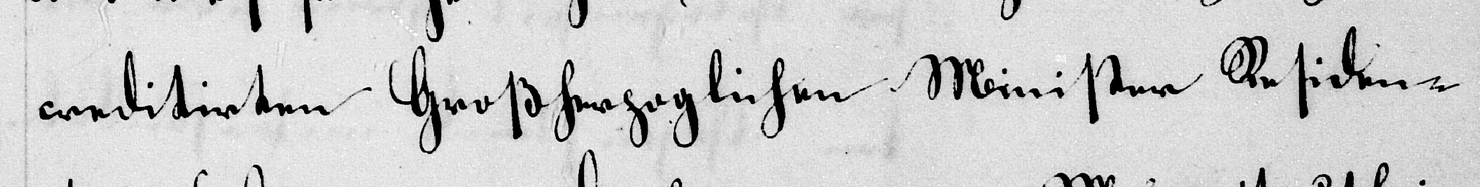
creditirten Großherzoglichen Minister Residen¬
